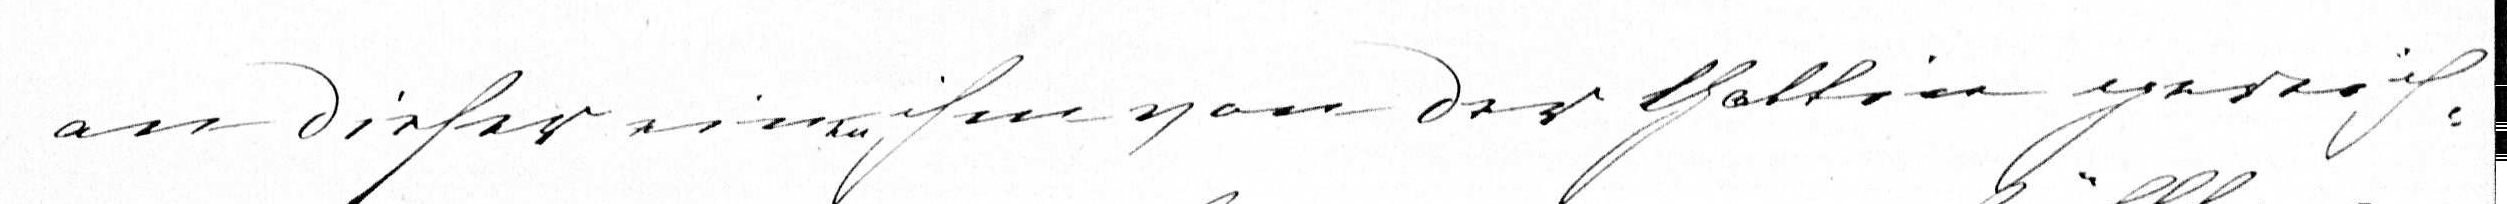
an dieser einen ihm von der Gattier gereich¬
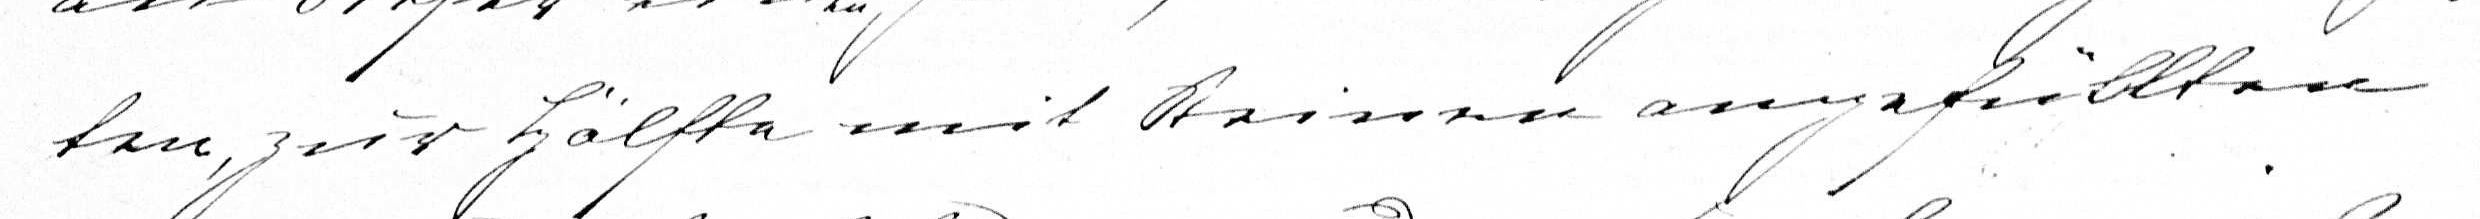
ten, zur Hälfte mit Steinen angefüllten
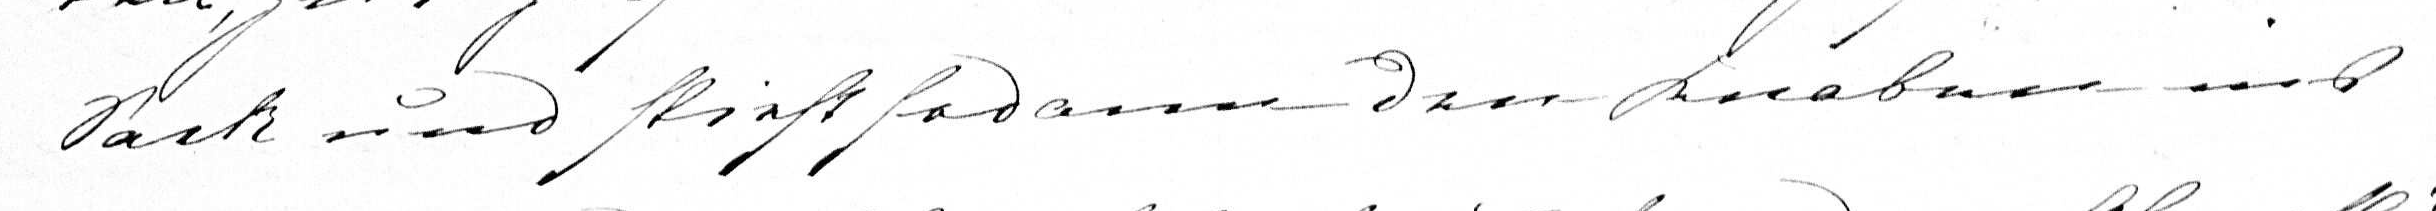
Sack und stiest sodann den Knaben ins
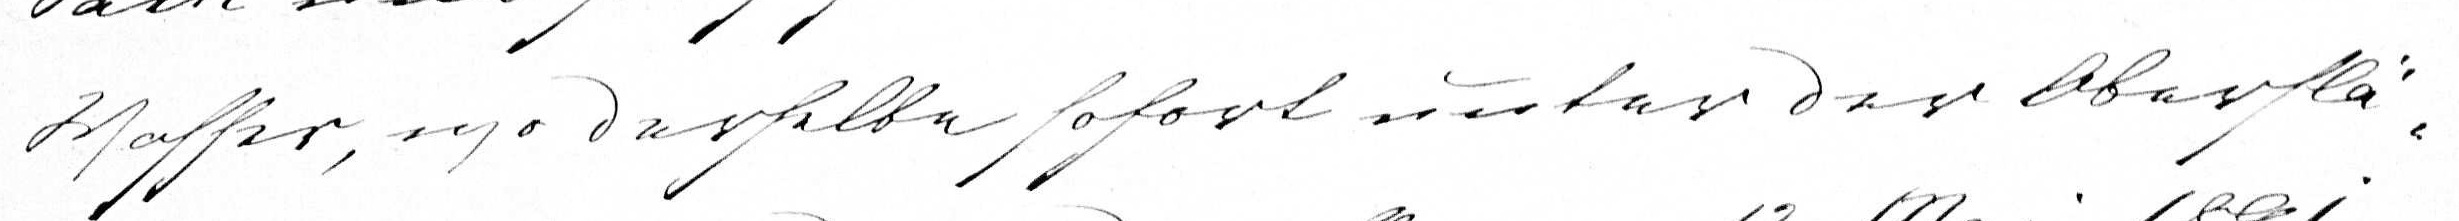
Wasser, wo derselbe sofort unter der Oberflä¬
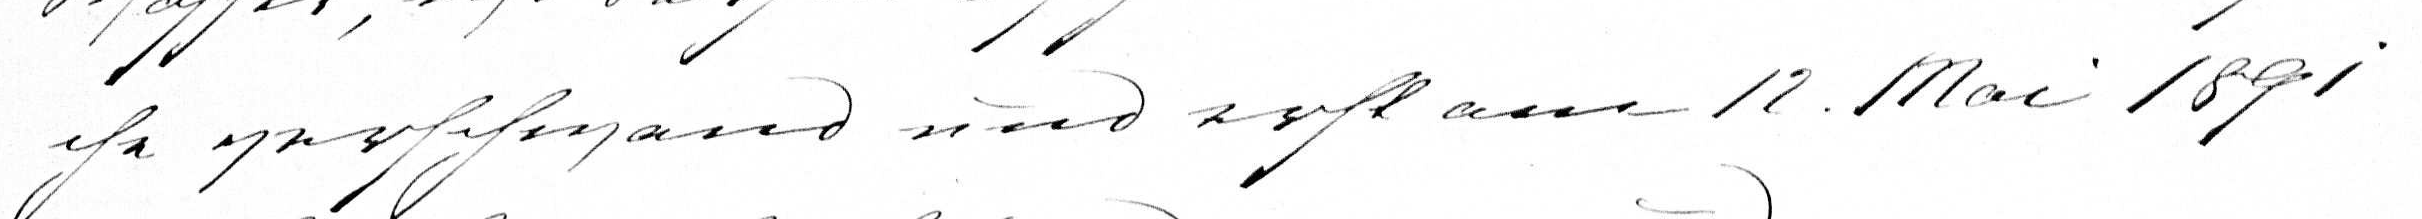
che verschwand und erst am 12. Mai 1891
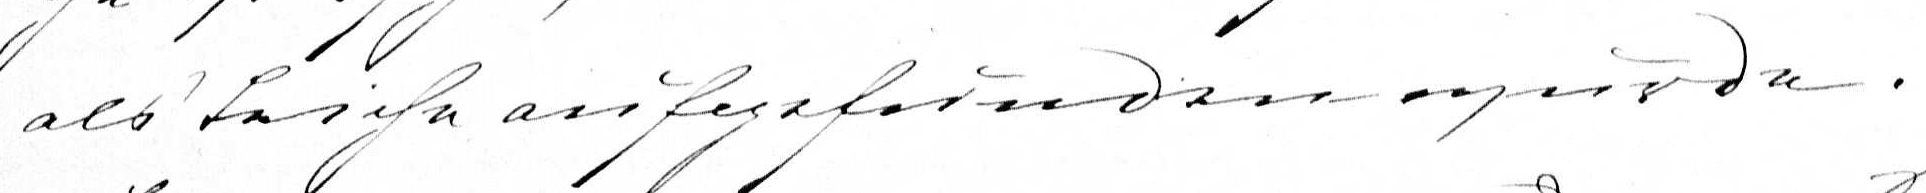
als Leiche aufgefunden wurde.
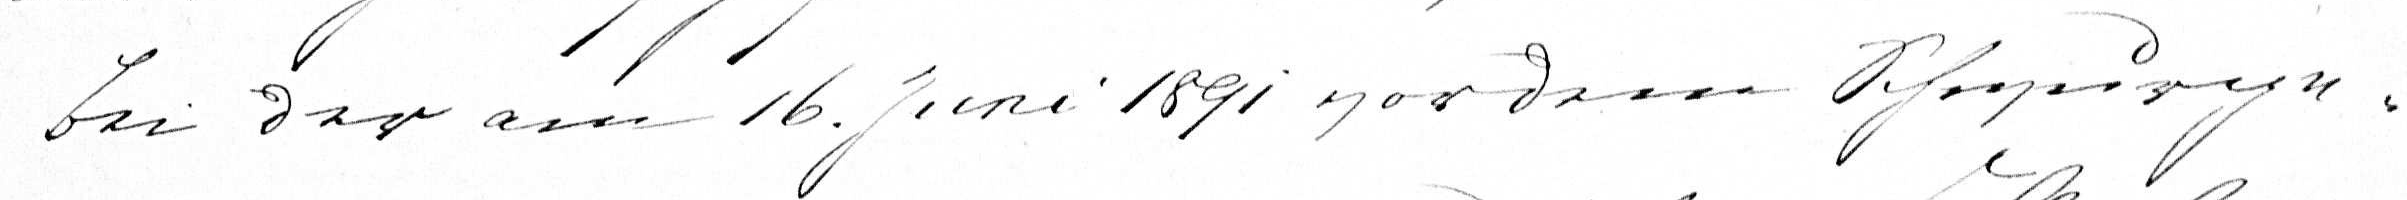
Bei der am 16. Juni 1891 vordem Schwurge¬
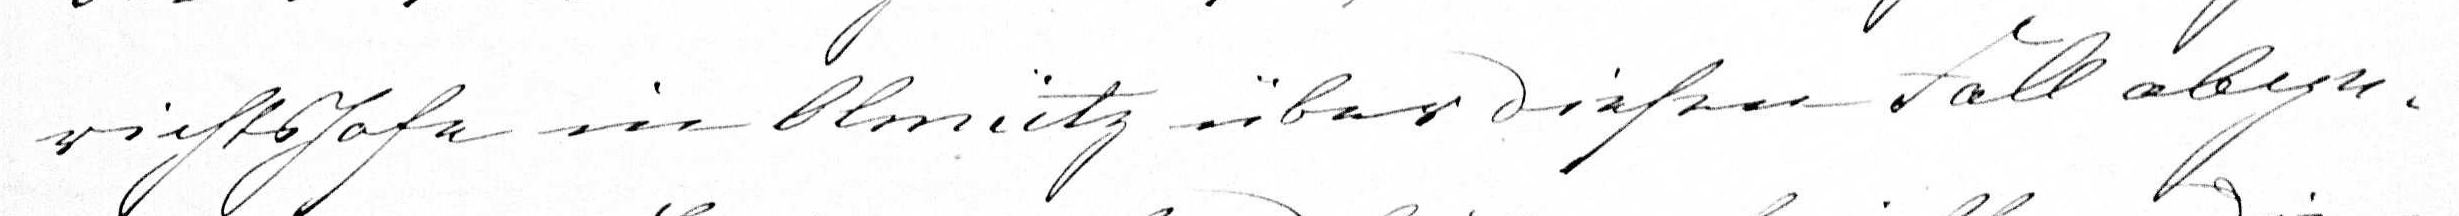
richtschofe in Olmütz über diesen Fall Abge¬
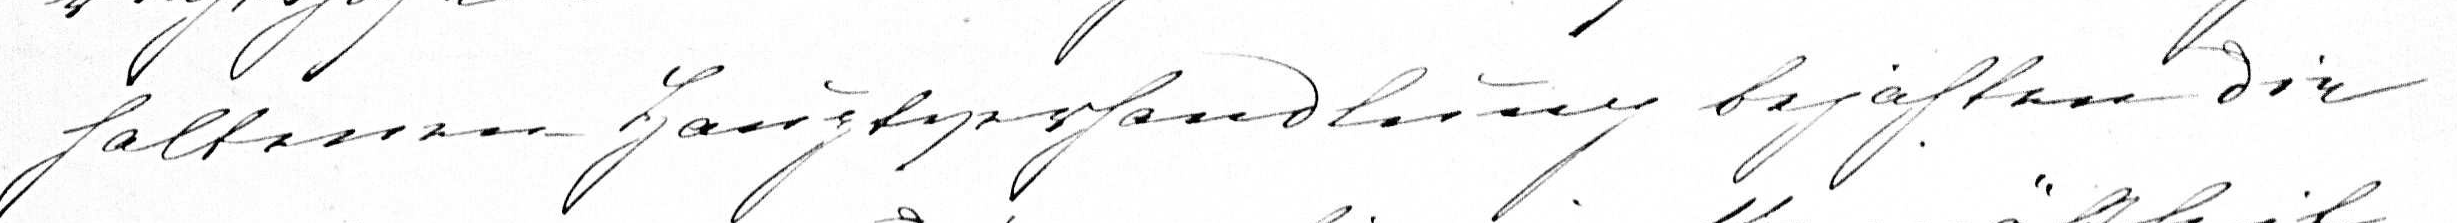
haltenen Hauptverhandlung bejahten die
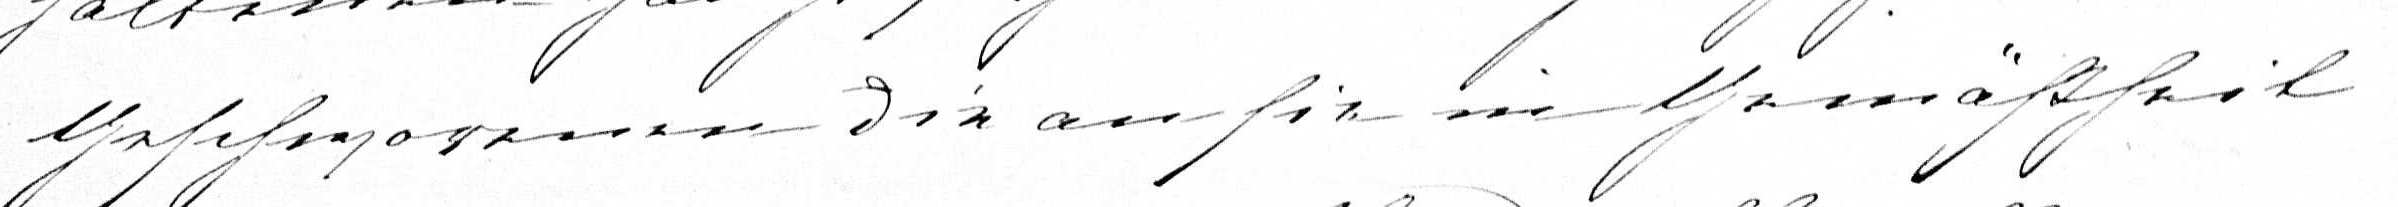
Geschworenen die an sie in Gemästheit
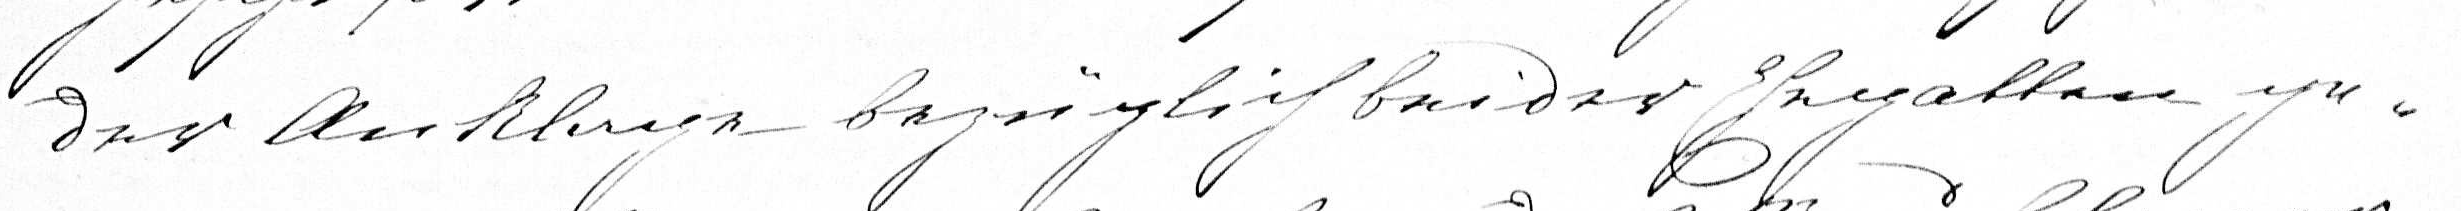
der Anklage bezüglich beider Ehegatten ge¬
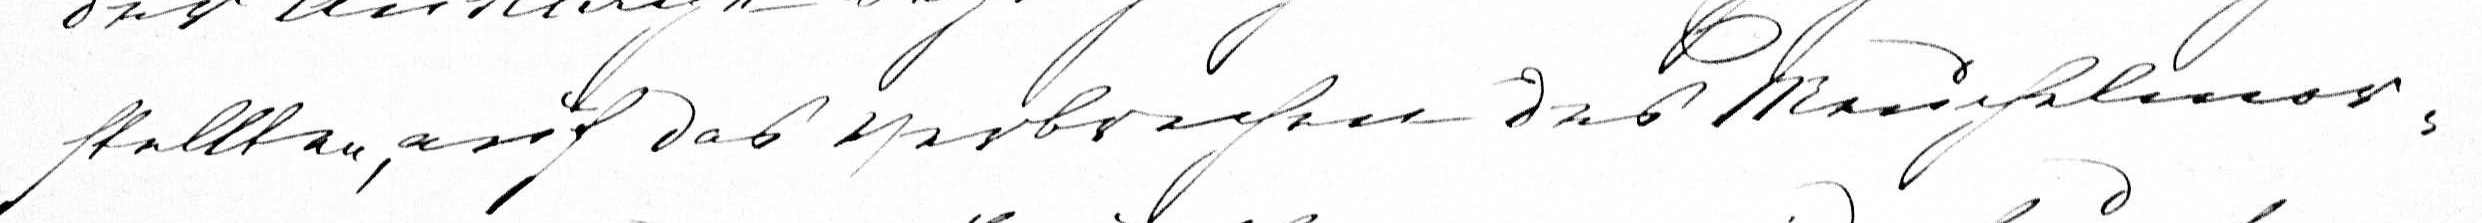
stellten, auf das Verbrechen des Meuchelmor¬
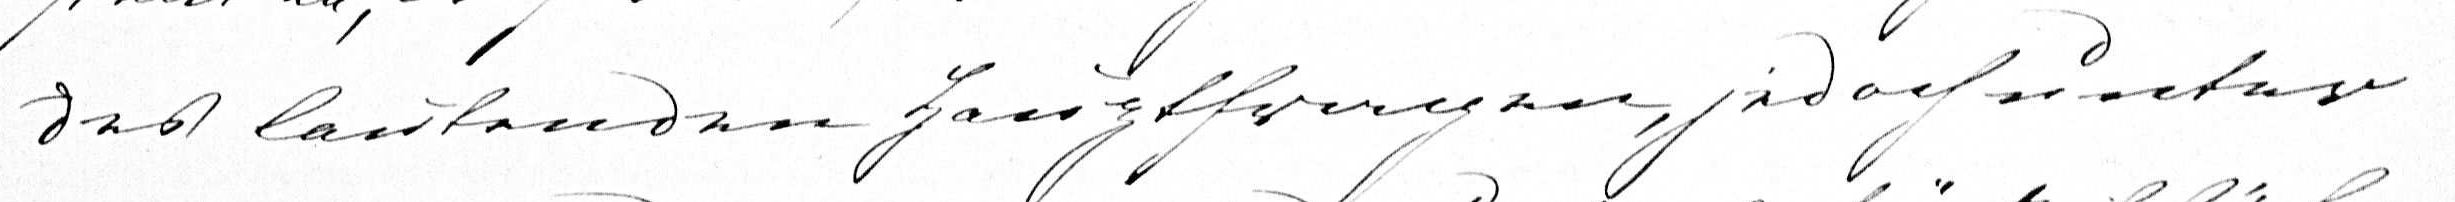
des lautenden Hauptfragen, jedoch unter
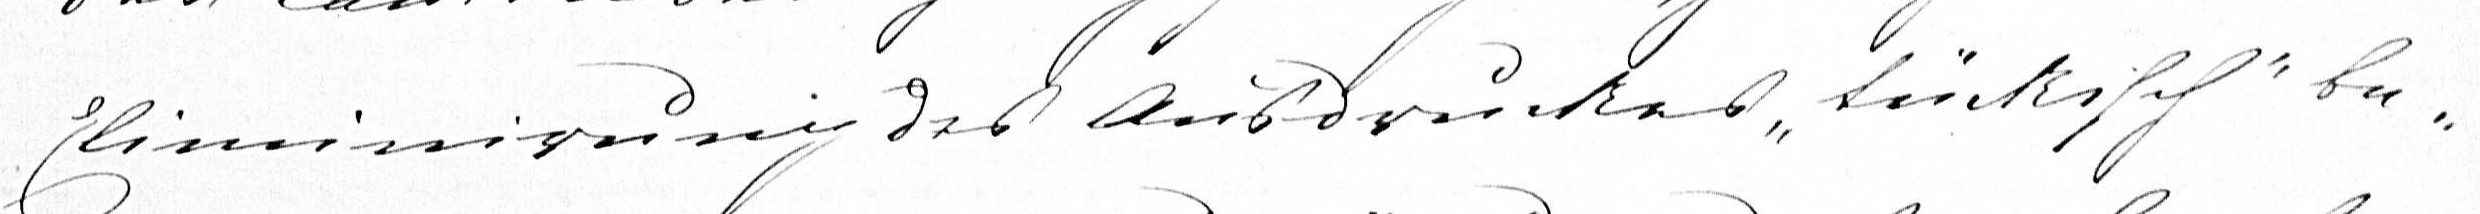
Eliminierung des Ausdruckes „Tückisch’’ be¬
